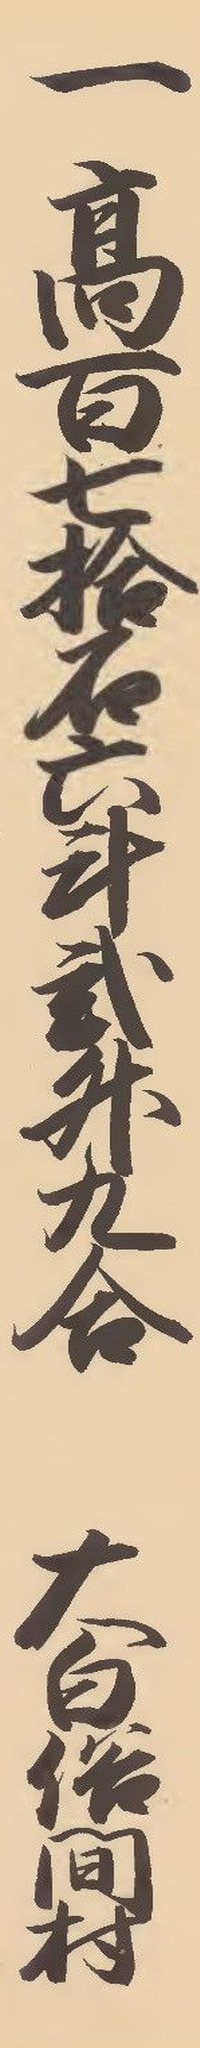一高百七拾石六斗弐升九合大白俗間村
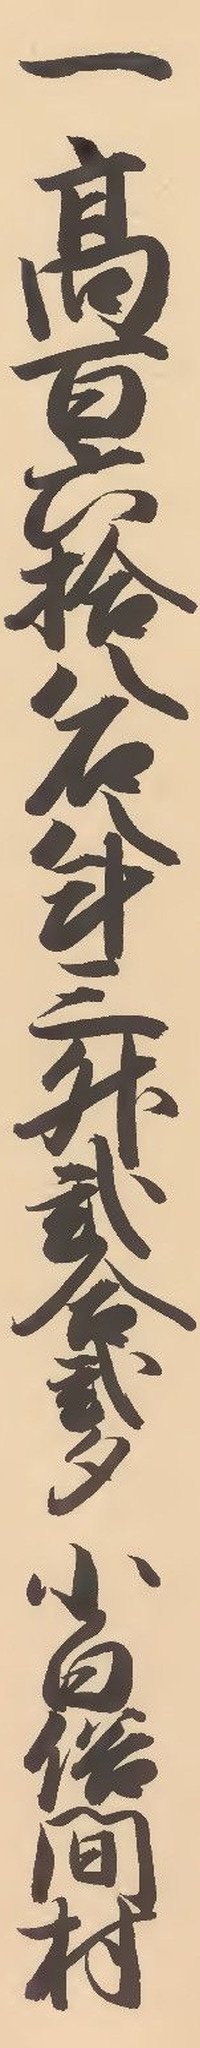一高百六拾八石八斗三升弐合弐勺小白俗間村
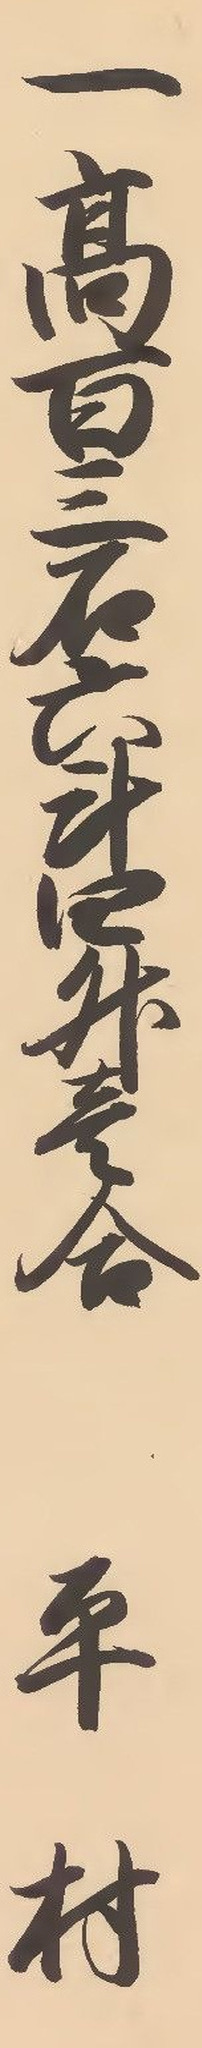一高百三石六斗四升壱合平村
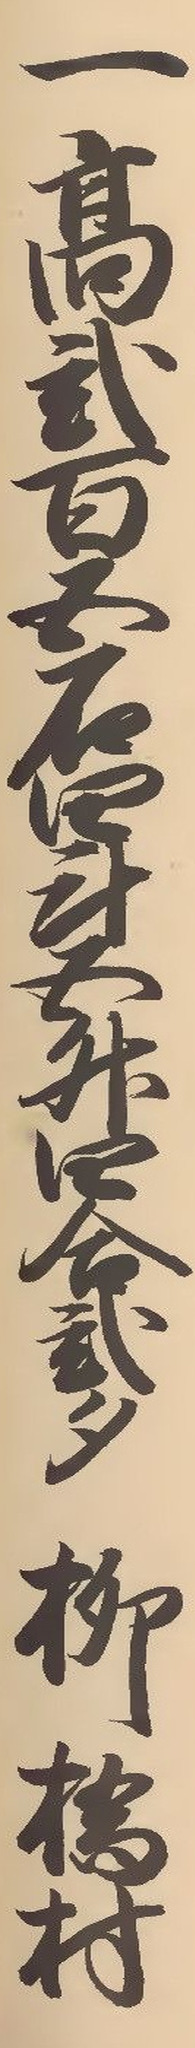一高弐百五石四斗五升四合弐勺柳橋村
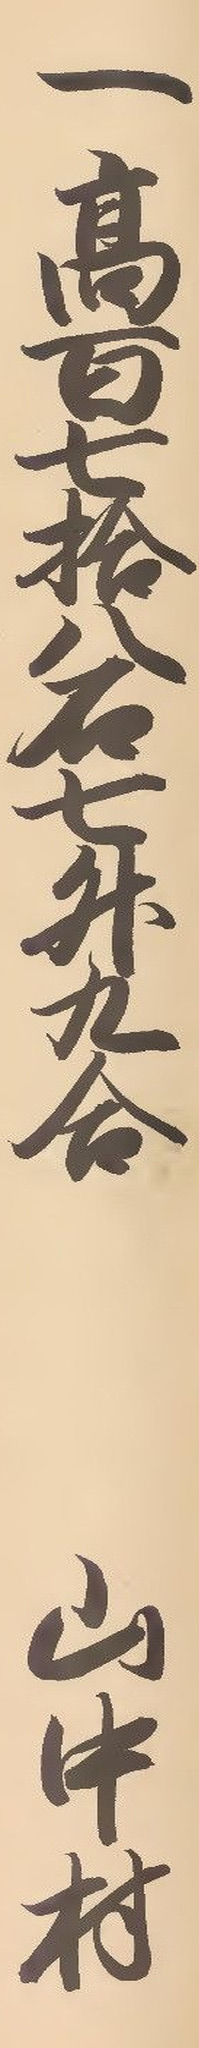一高百七拾八石七升九合山中村
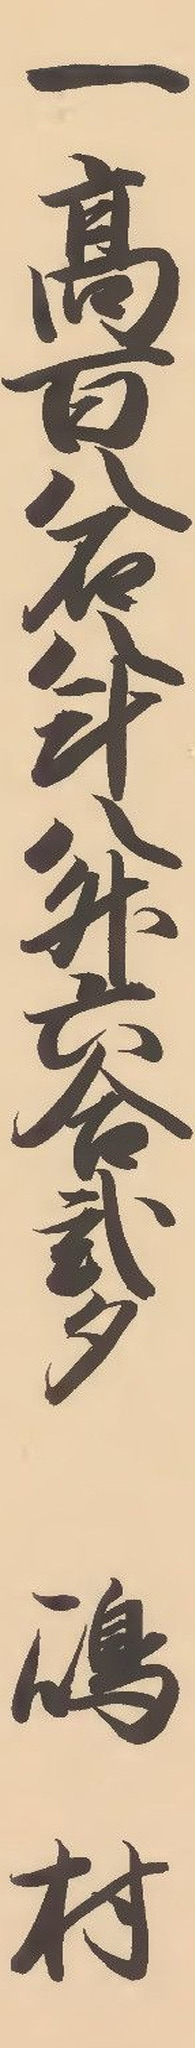一高百八石八斗八升六合弐勺島村
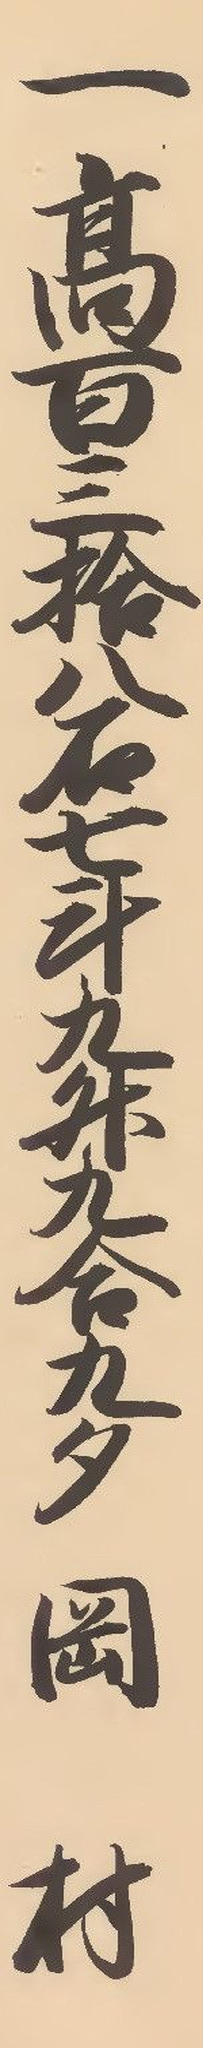一高百三拾八石七斗九升九合九勺岡村
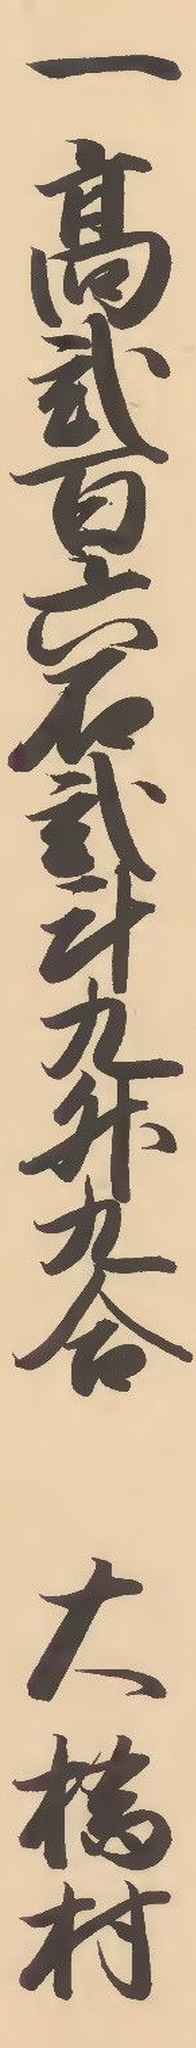一高弐百六石弐斗九升九合大橋村

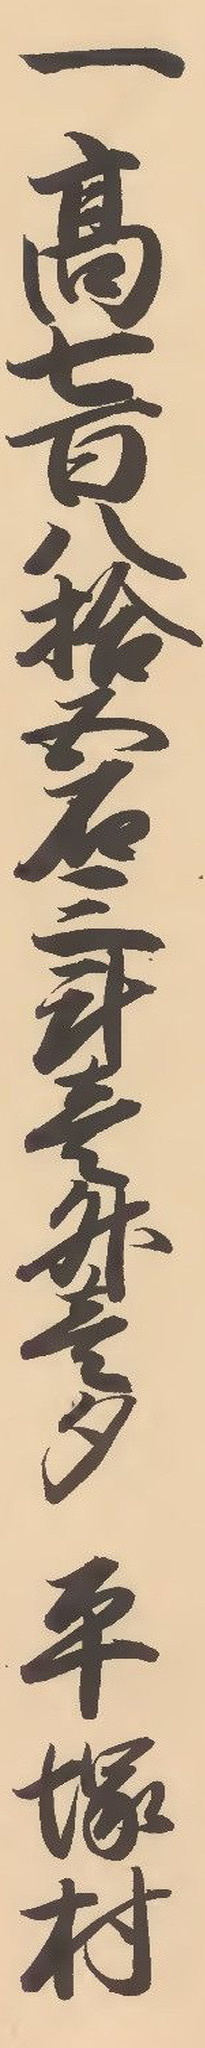一高七百八拾五石三斗壱升壱勺平塚村
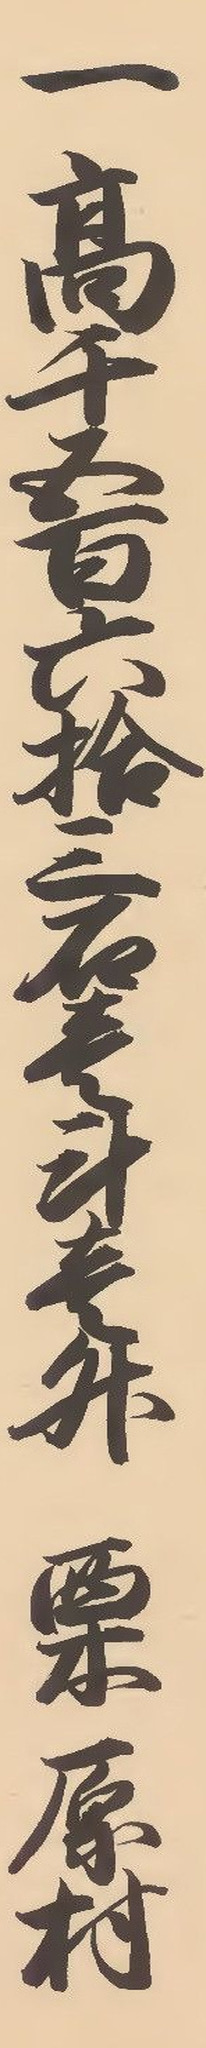一高千五百六拾三石壱斗壱升栗原村
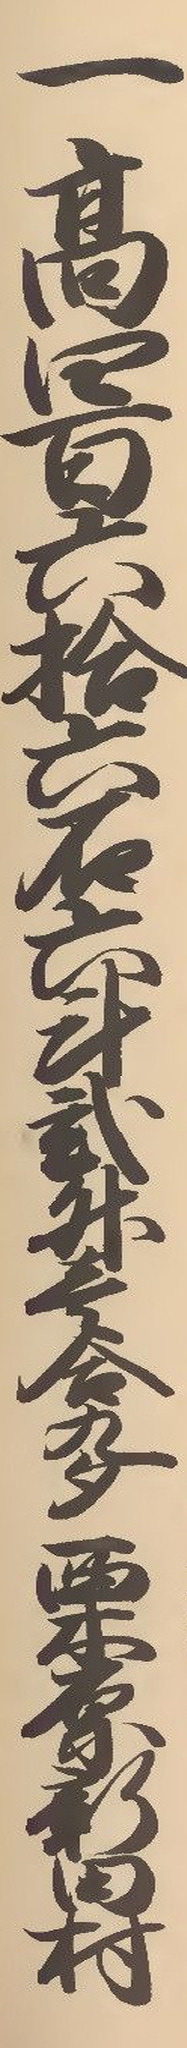一高四百六拾六石六斗弐升壱合九勺栗原新田村
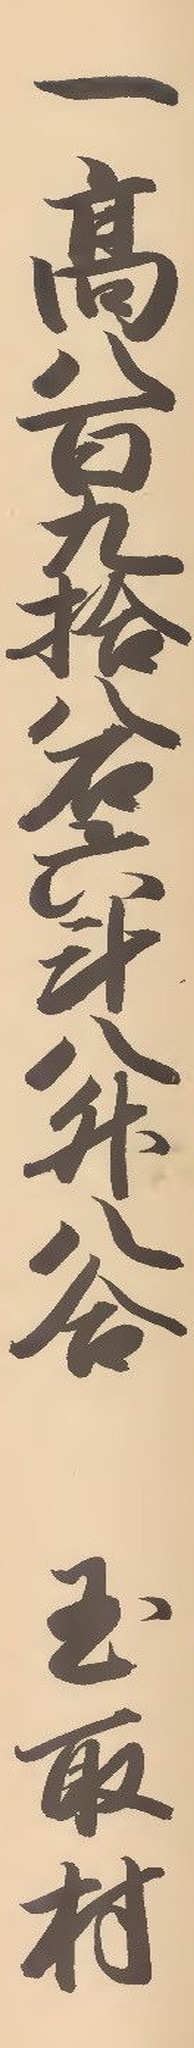一高八百九拾八石六斗八升八合玉取村
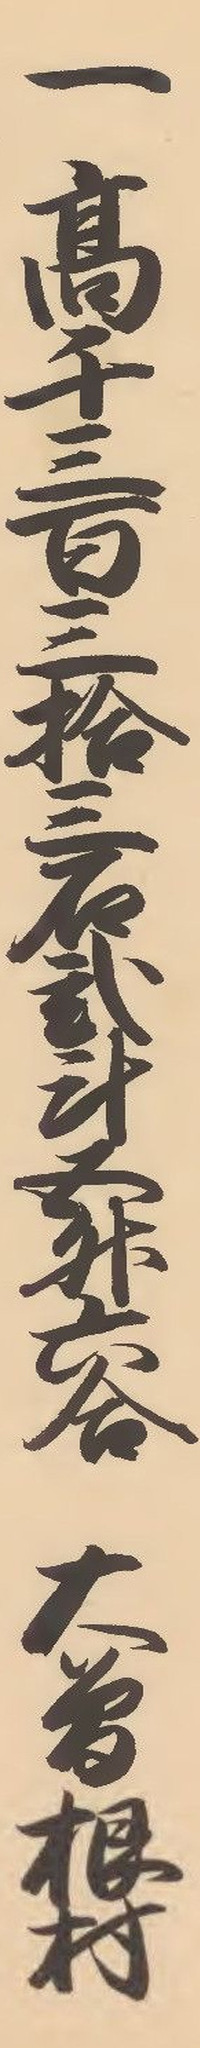一高千三百三拾三石弐斗五升六合大曽根村
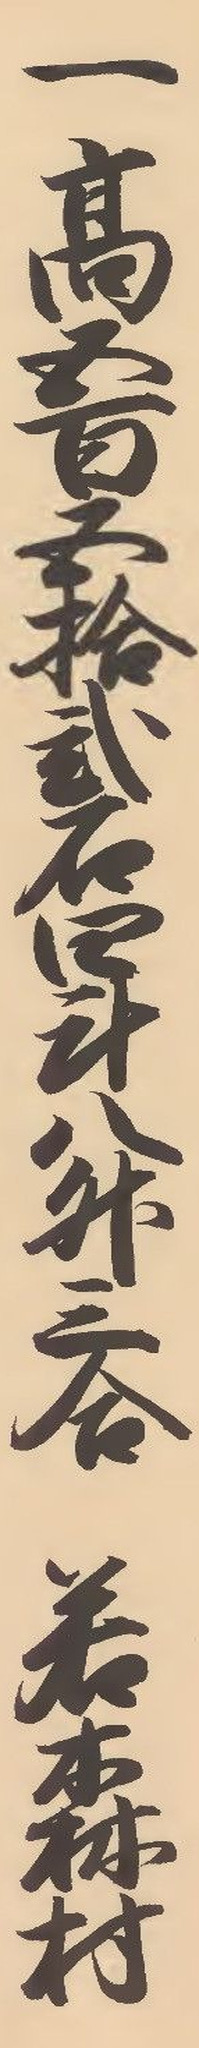一高五百五拾弐石四斗八升三合若森村
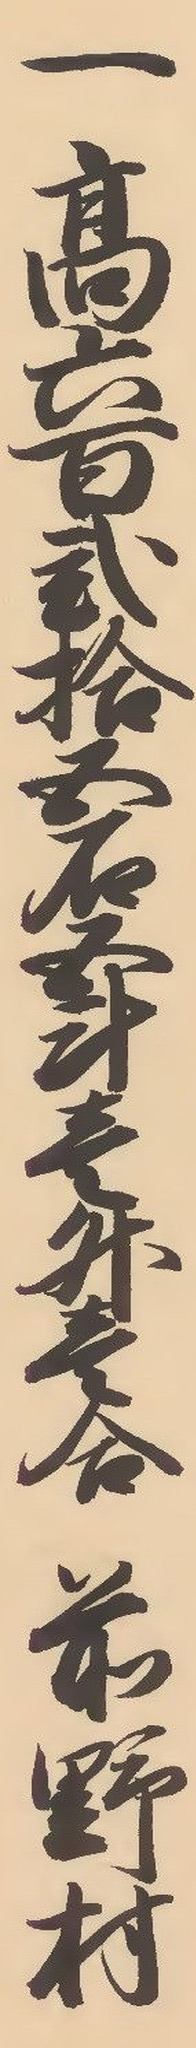一高六百弐拾五石五斗壱升壱合前野村

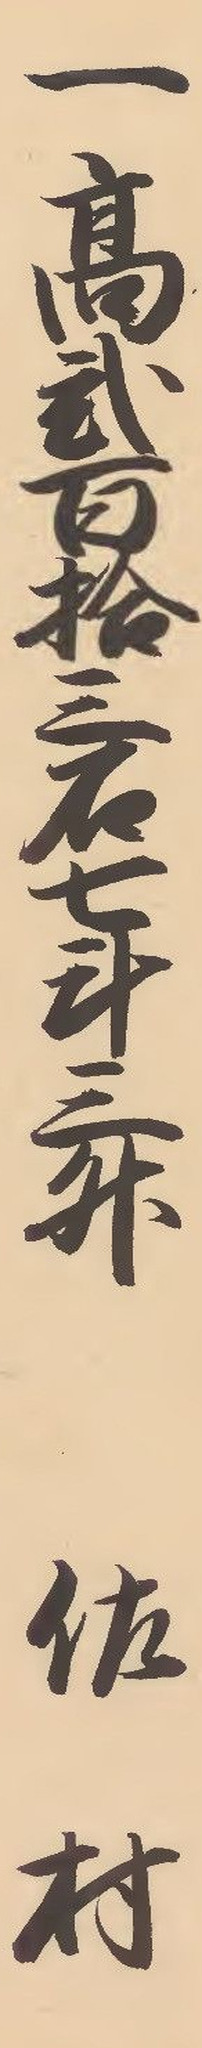一高弐百拾三石七斗三升佐村
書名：常陸国郷帳
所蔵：国立公文書館 National Archives of Japan
